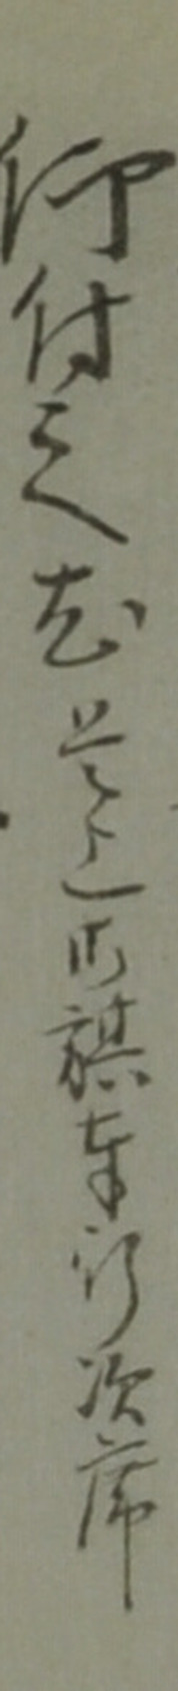仰付之尤是迄御旗奉行次席
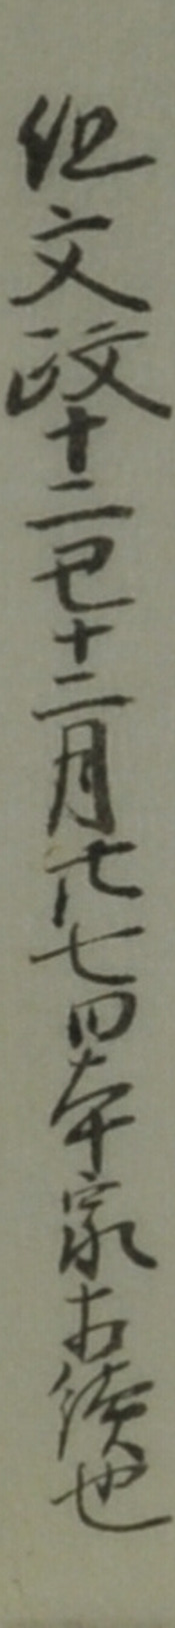但文政十二巳十二月廿七日本家相続也
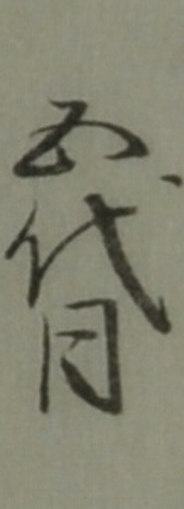五代目
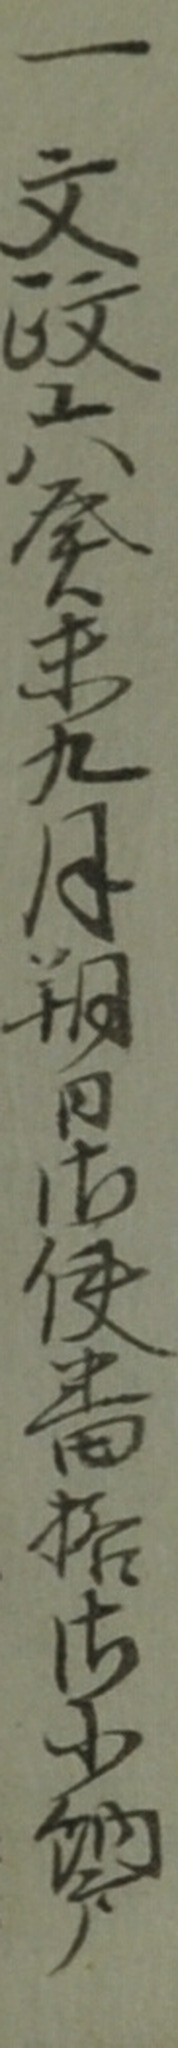一文政六癸未九月朔日御使番格御小納戸
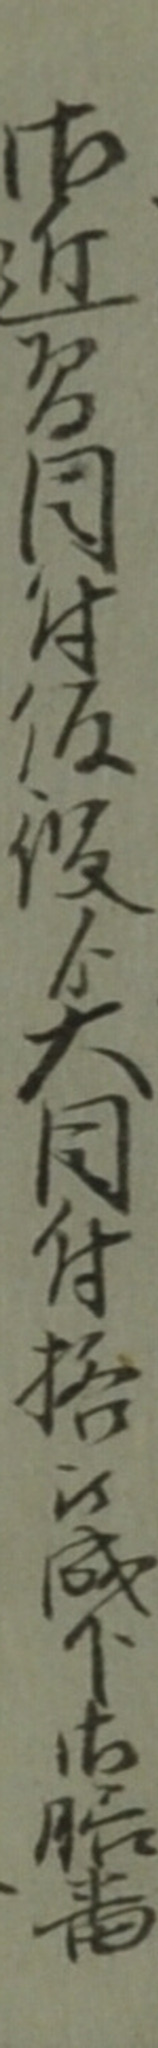御近習目付仮役ゟ大目付格被成下御膳番
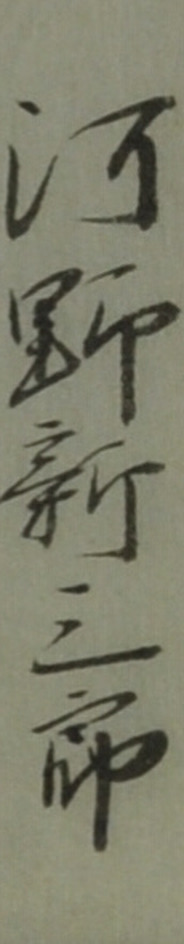河野新三郎
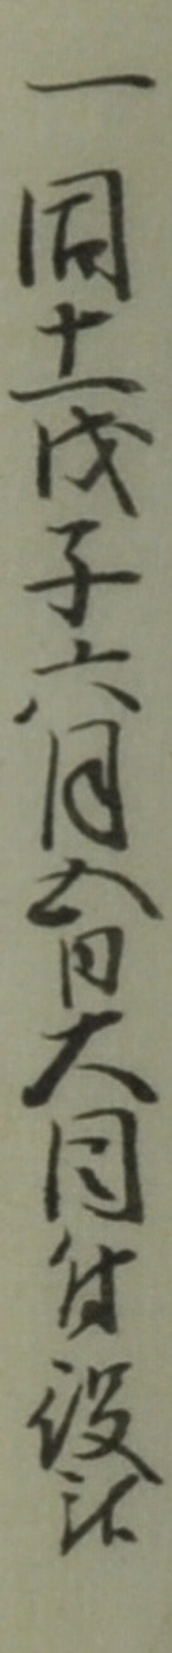一同十一戊子六月五日大目付役被
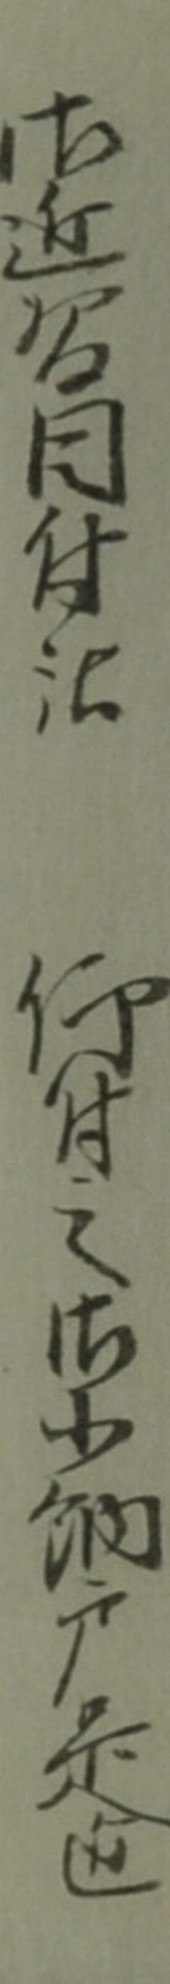御近習目付被仰付之御小納戸是迄

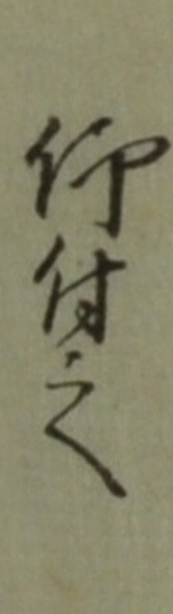仰付之
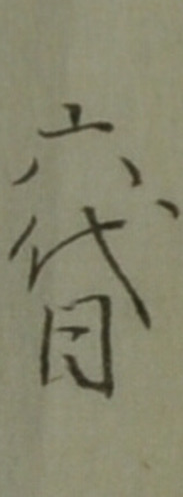六代目
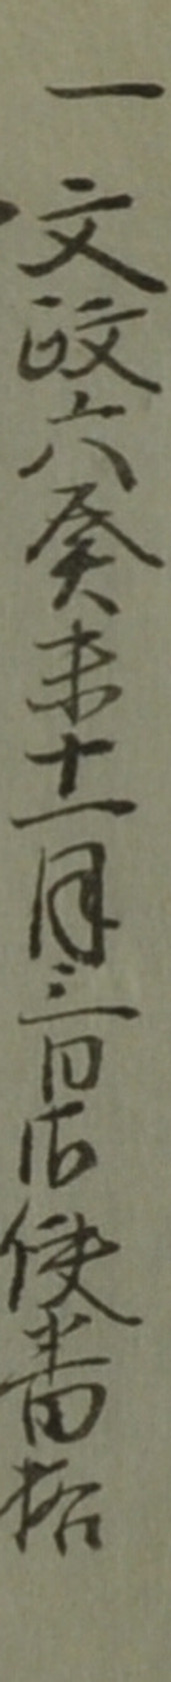一文政六癸未十一月三日御使番格
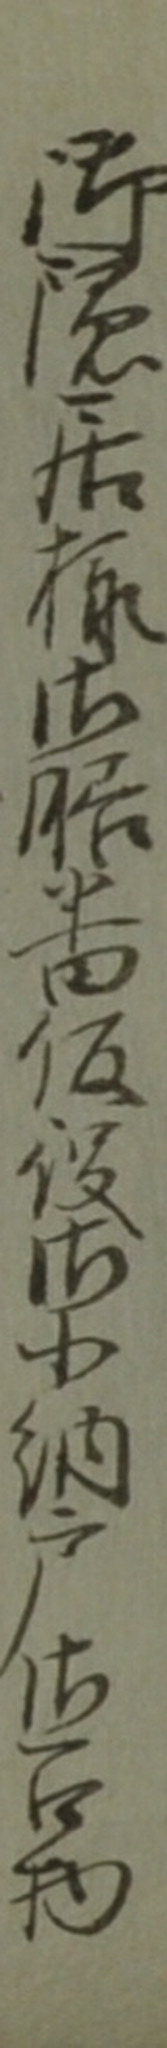御隠居様御膳番仮役御小納戸御召物
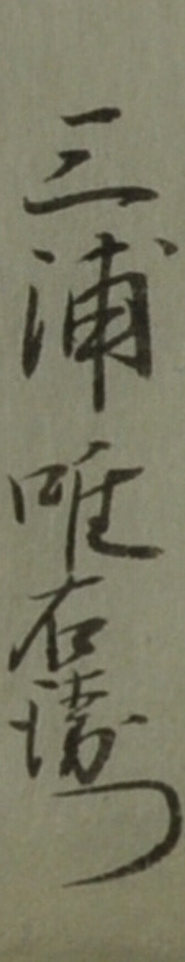三浦唯右衛門
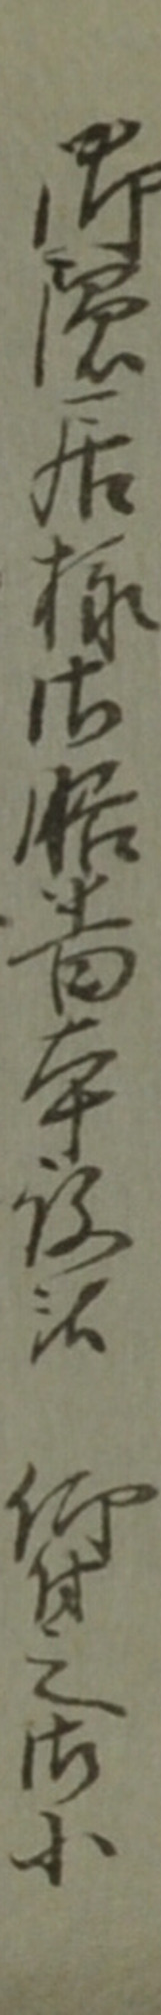御隠居様御膳番本役被仰付之御小
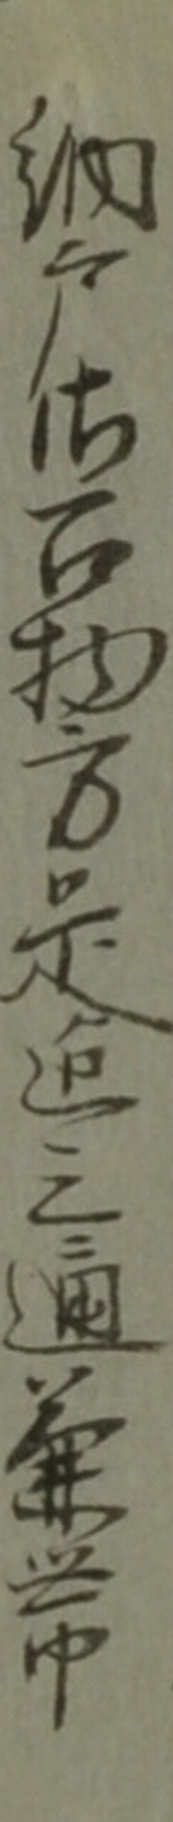納戸御召物方是迄之通兼帯
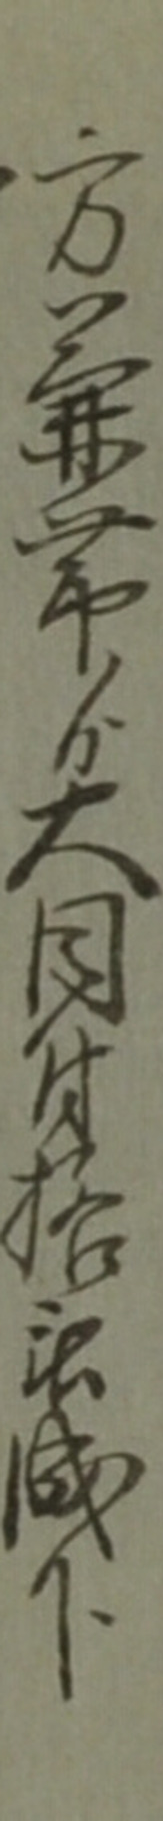方兼帯ゟ大目付格被成下
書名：諸御役代々録（四）
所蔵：伊那市立高遠町図書館・合同会社AMANE
